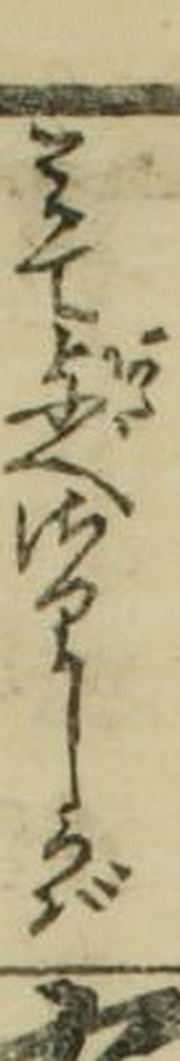みて与へさりしかば
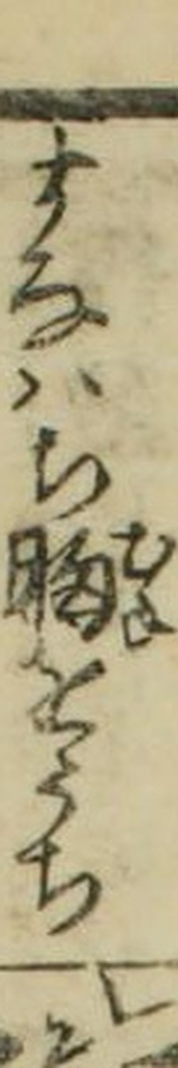すなはち胸をうち
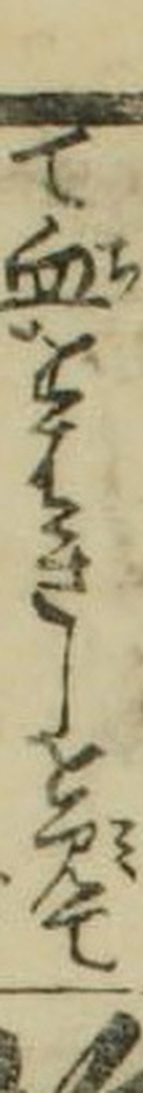て血をはきしを見て
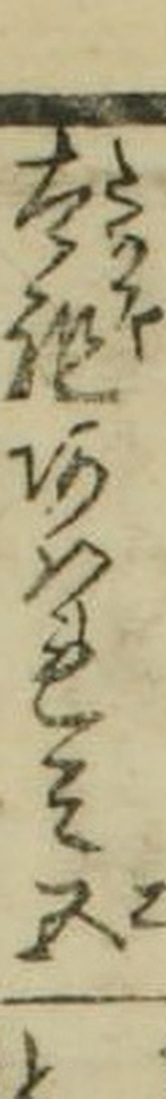太祖あはれみ五
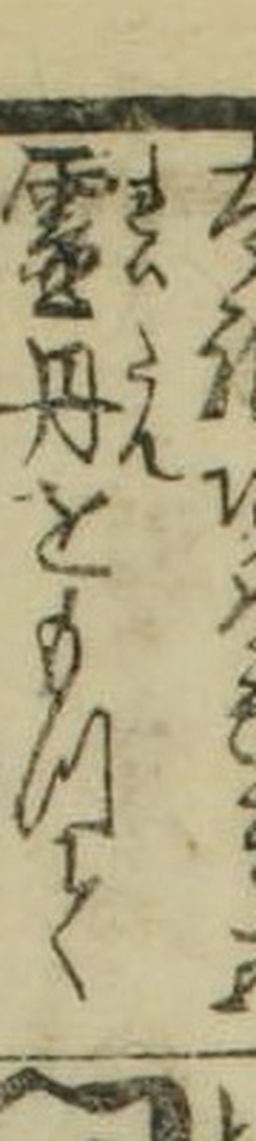霊丹をもつて
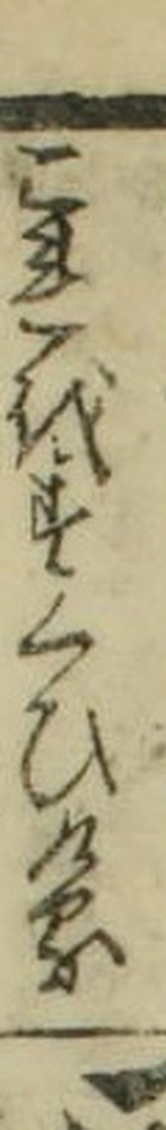これをすくひける
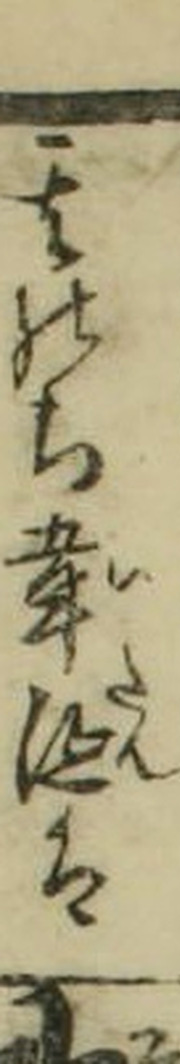其のち韋誕は
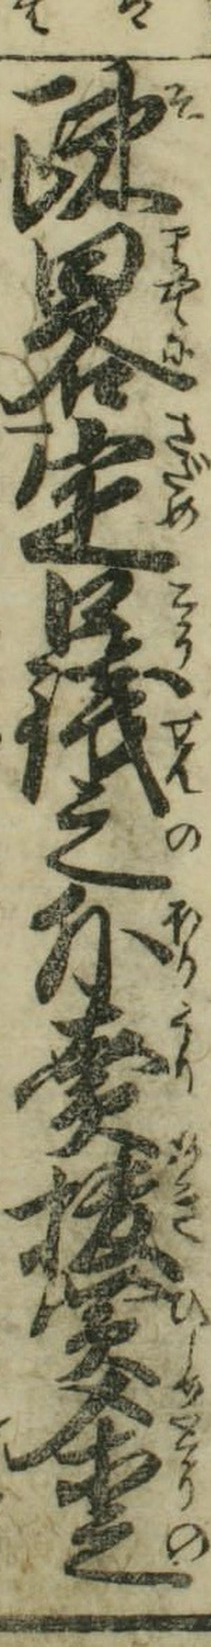疎畧定口銭之外賣抜買〆等之
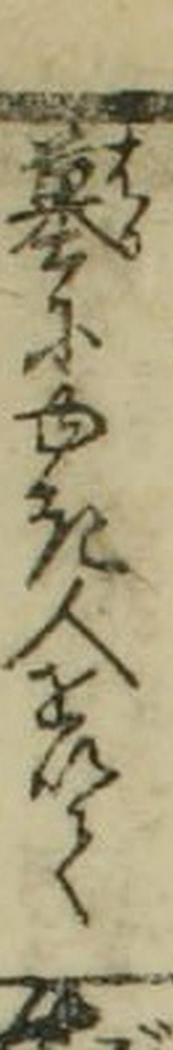墓にゆき人を以て
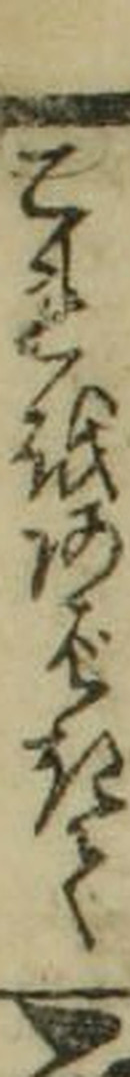これをあばきて

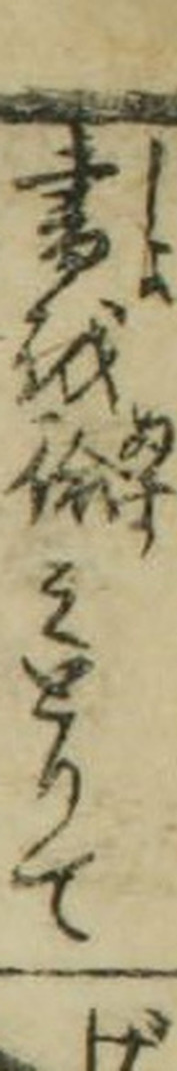書を偸みとりて
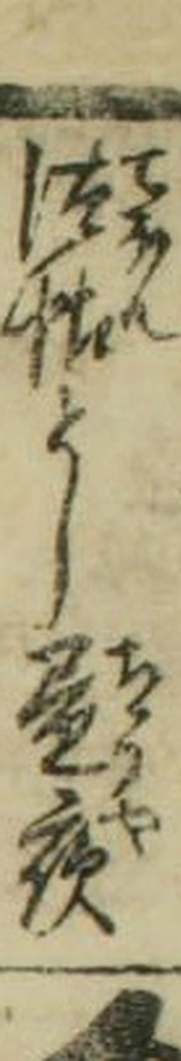法帖とし昼夜
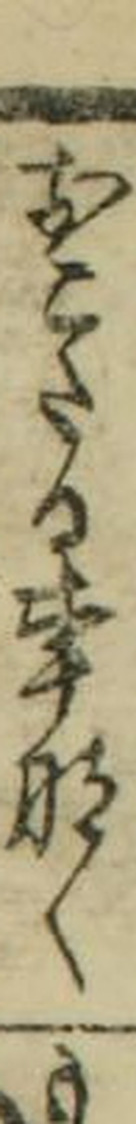おこたる事なく
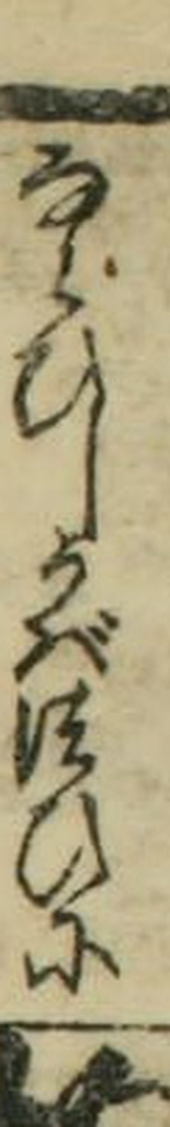ならひしかばつひに
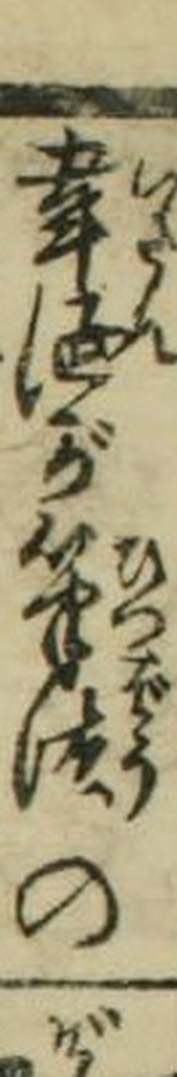韋誕が筆法の
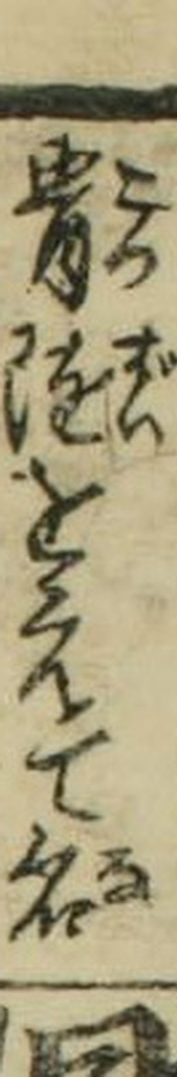骨随をえて名
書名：増補職人往来
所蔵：東京学芸大学教育コンテンツアーカイブ
